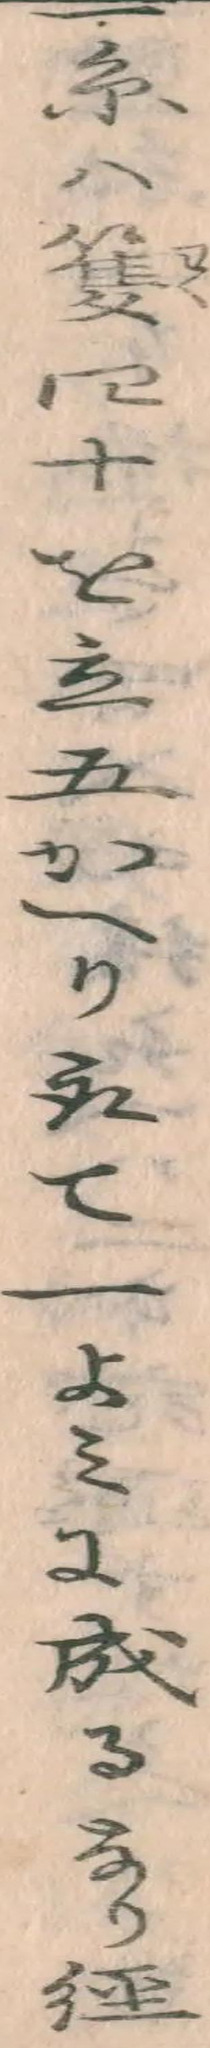一糸は篗四十を立五かへり取て一よみに成るなり経
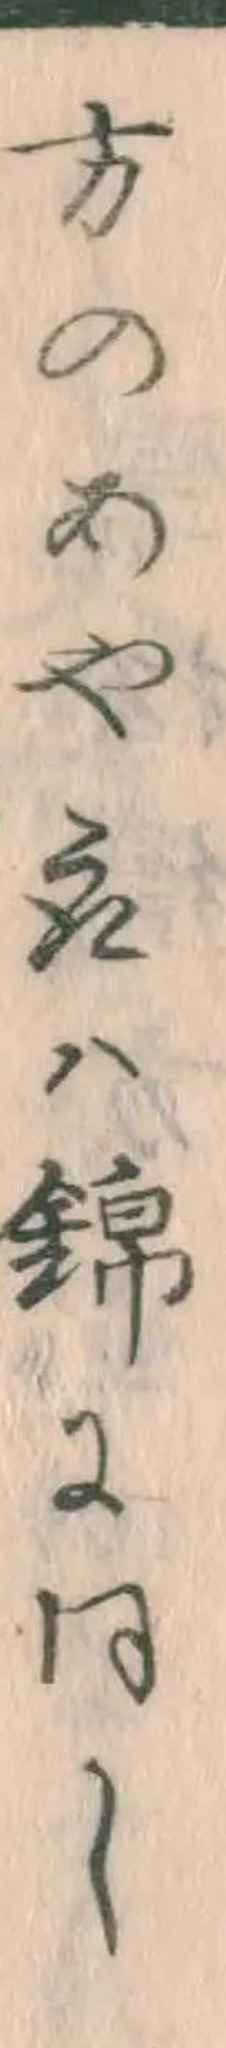方のあや取は錦に同し
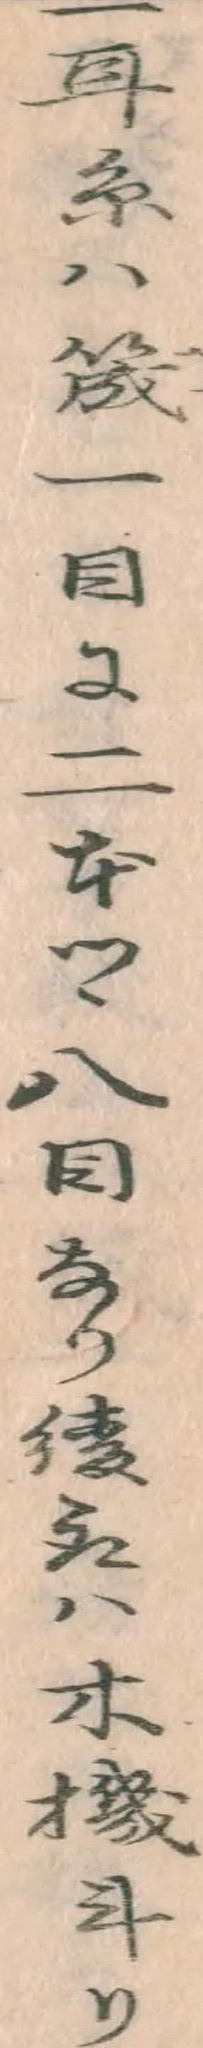一耳糸は筬一目に二本つゝ八目なり綾取は木機斗り
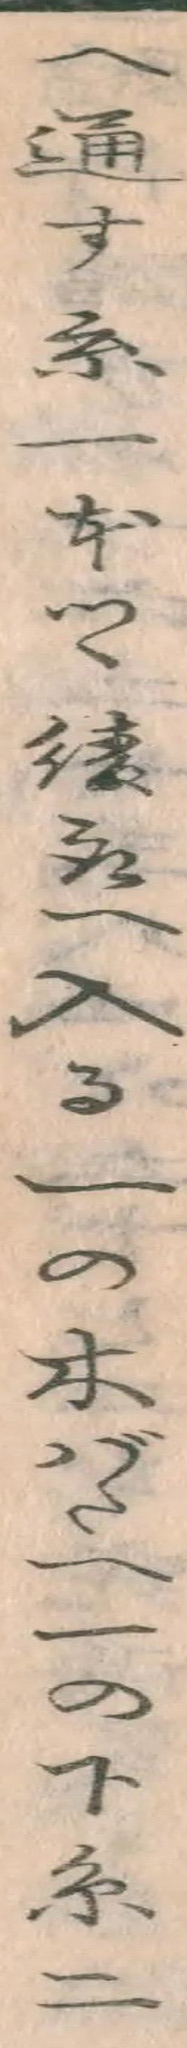へ通す糸一本つゝ綾取へ入る一の木ばたへ一の下糸二
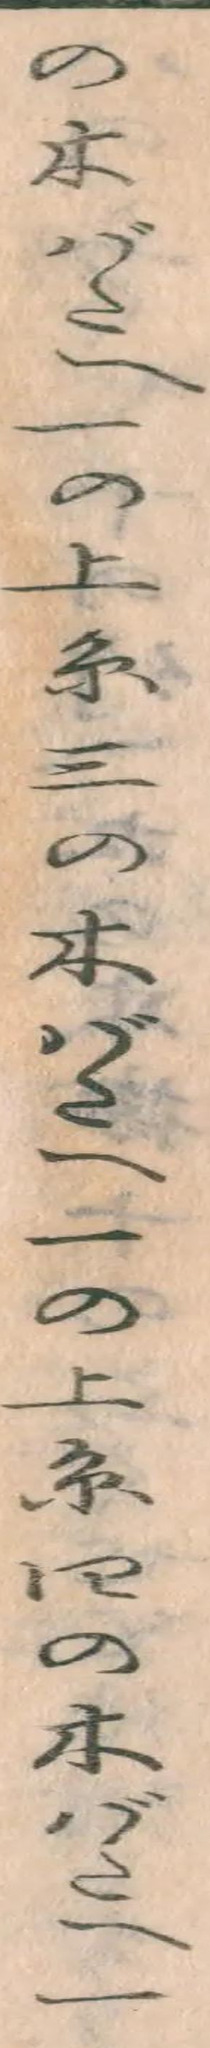の木ばたへ一の上糸三の木ばたへ一の上糸四の木ばたへ一
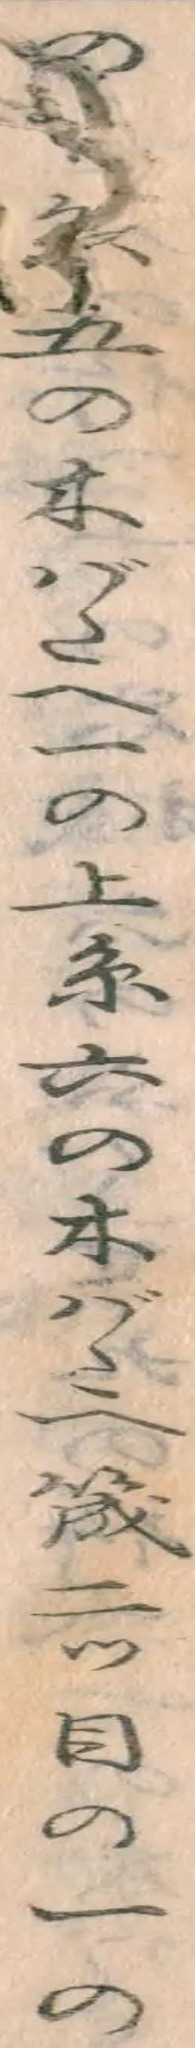の下糸五の木ばたへ一の上糸六の木ばたへ筬二ッ目の一の
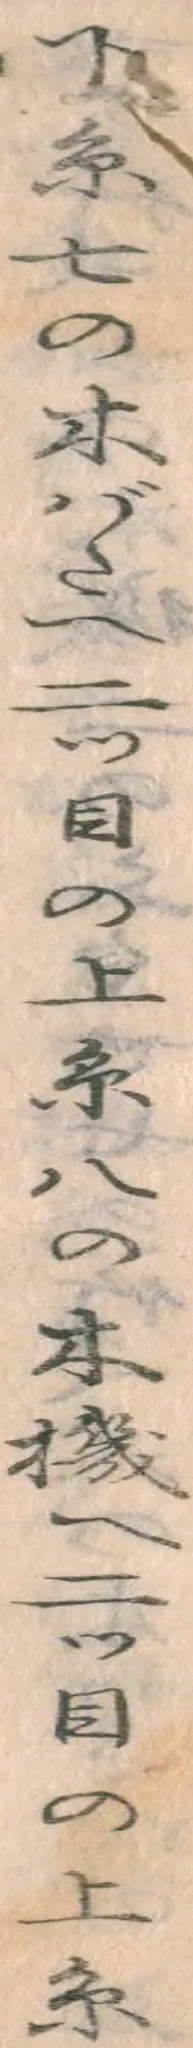下糸七の木ばたへ二ッ目の上糸八の木機へ二ッ目の上糸
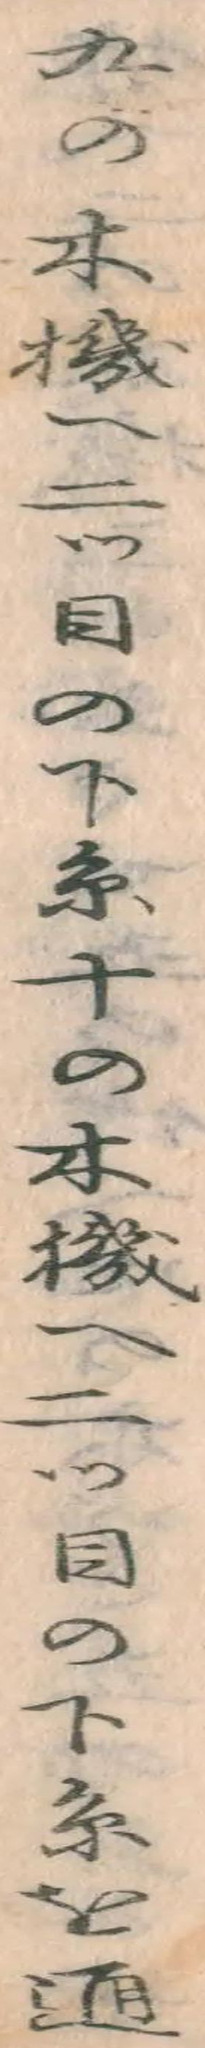九の木機へ二ッ目の下糸十の木機へ二ッ目の下糸を通
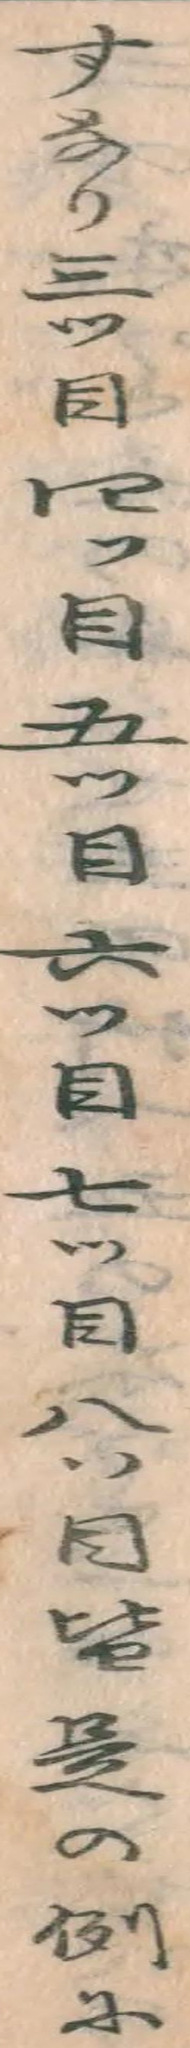すなり三ッ目四ッ目五ッ目六ッ目七ッ目八ッ目皆是の例に
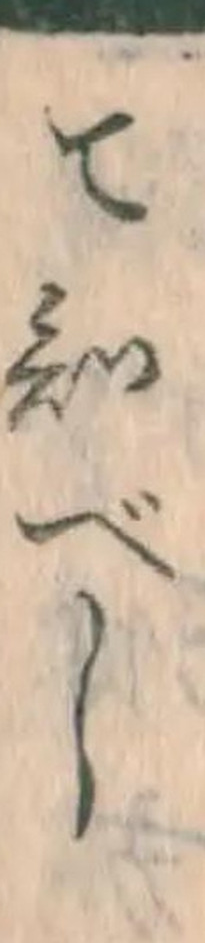て知べし

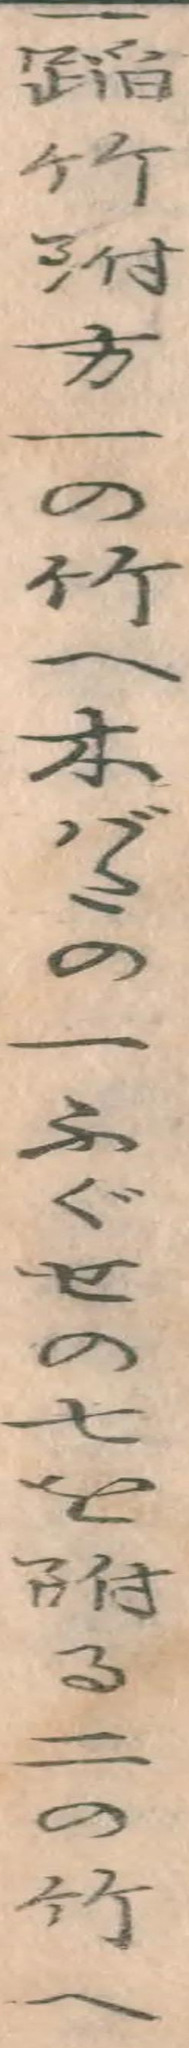一蹈竹附方一の竹へ木ばたの一ふぐせの七を附る二の竹へ
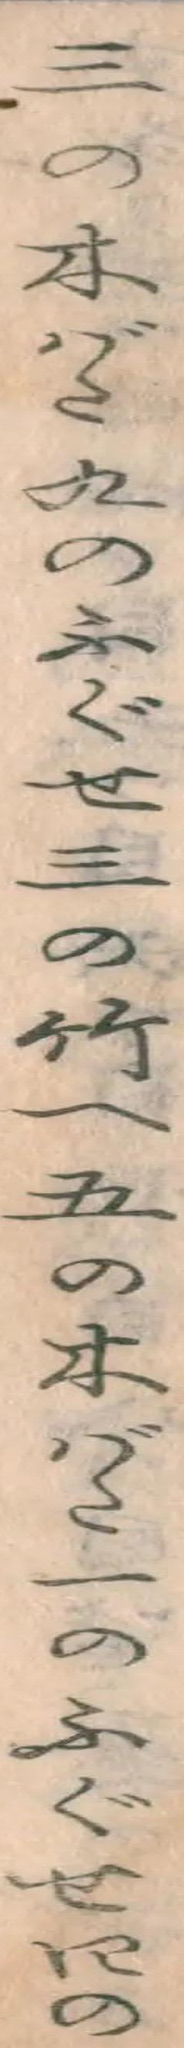三の木ばた九のふぐせ三の竹へ五の木ばた一のふぐせ四の
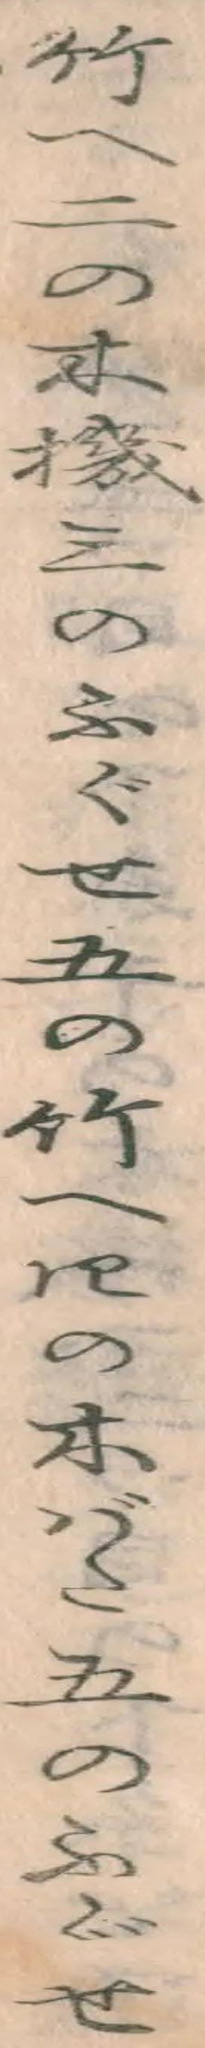竹へ二の木機三のふぐせ五の竹へ四の木ばた五のふぐせ
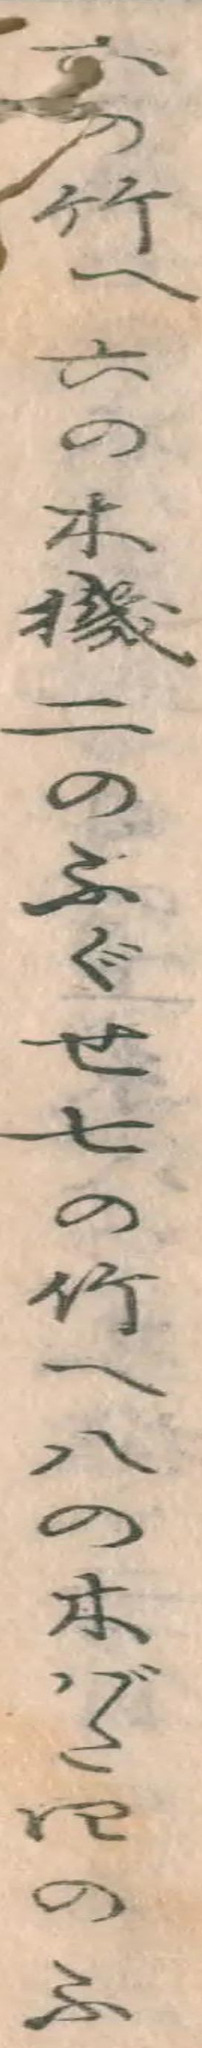六の竹へ六の木機二のふぐせ七の竹へ八の木ばた四のふ
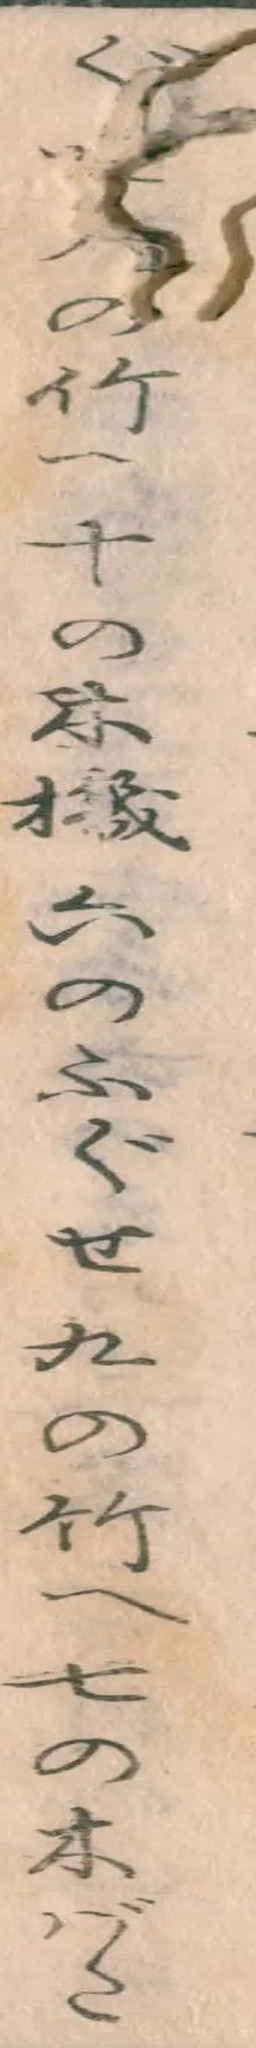ぐせ八の竹へ十の木機六のふぐせ九の竹へ七の木ばた
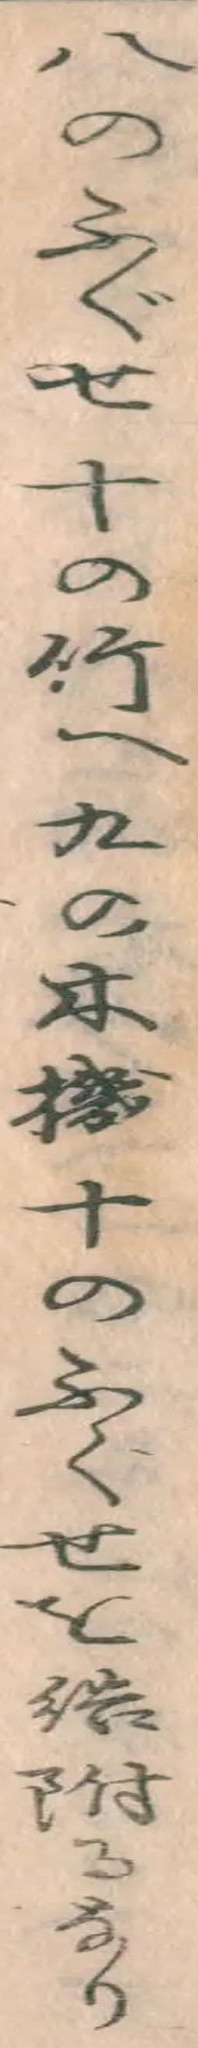八のふぐせ十の竹へ九の木機十のふぐせを結附るなり
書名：機織彙編 5巻. [2]
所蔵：国立国会図書館 National Diet Library, JAPAN
